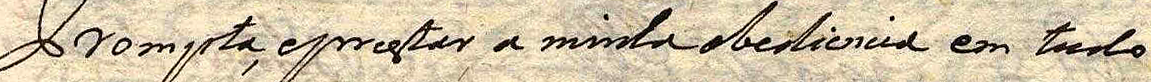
Prompta, e prestar, a minha obediencia em tudo
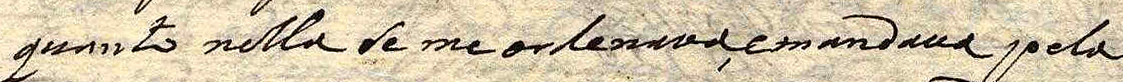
quanto nella se me ordenava, e mandaua pela
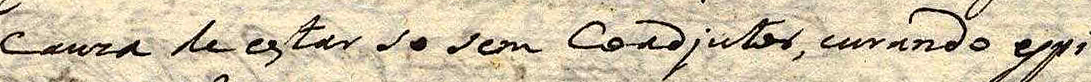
cauza de estar so sem coadjutor, curando espi
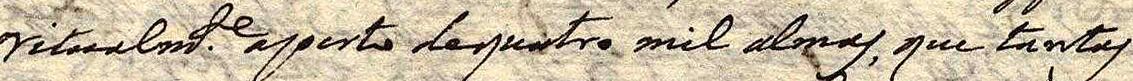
ritualm.te a perto de quatro mil almas, que tantas
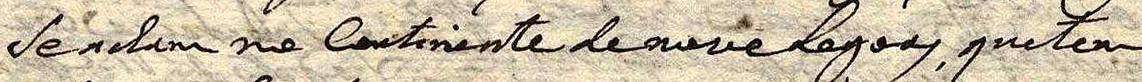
se acham no Continente de nove Legoas, que tem
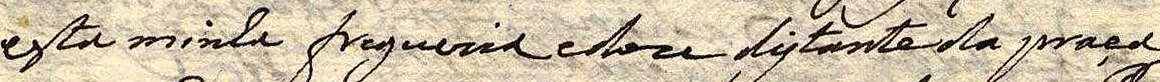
esta minha freguezia e doze distante da praça
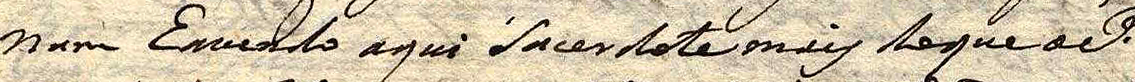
nam havendo aqui Sacerdote mais do que o P.
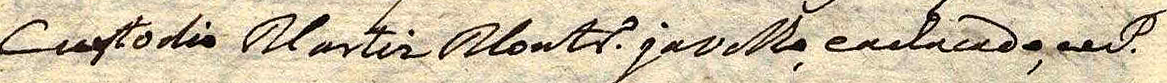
Custodio Martiz Montr.o ja velho, e achacado, e o P.
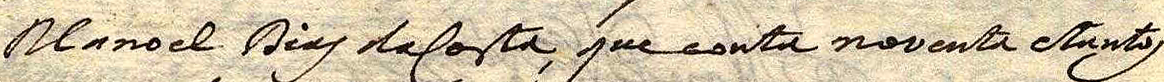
Manoel Dias da Costa, que conta noventa e tantos
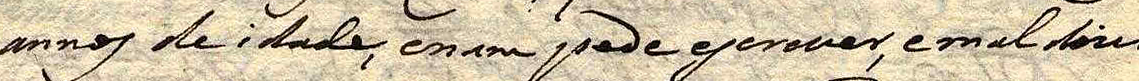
annos de idade, e nam pode escrever, e mal dizer
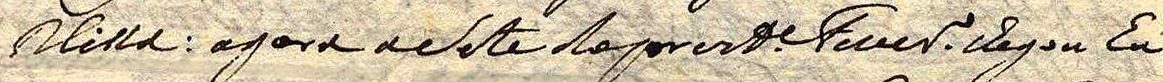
Missa: agora a sete do prezt.e Fever.o chegou hū
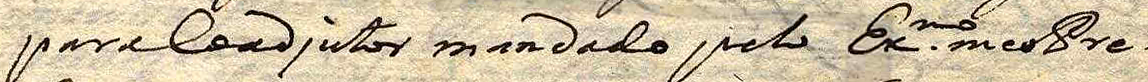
para Coadjutor mandado pelo Ex.mo meo Pre
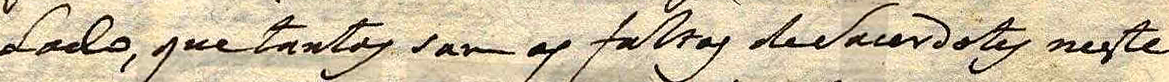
Lado, que tantos sam as faltas de Sacerdotes neste
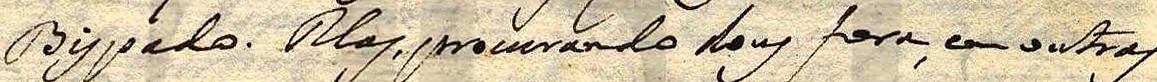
Bispado. Mas, procurando dous fora, em outras
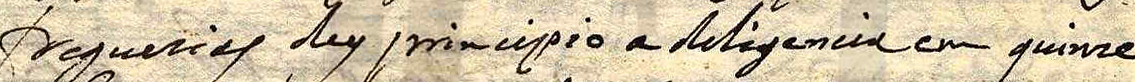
freguezias dey principio a deligencia em quinze
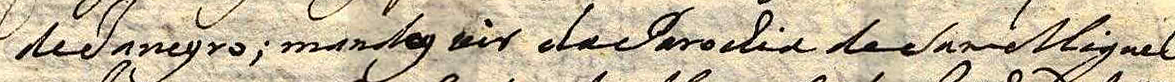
de Janeyro; mandey vir da Parochia de Sam Miguel
